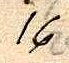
16.
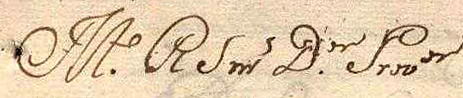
Mt.o R Snr̄ D.or Prov.or
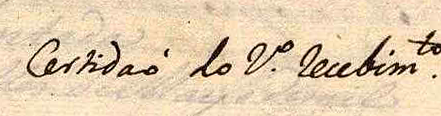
Certidaõ do 2.o Recebim.to
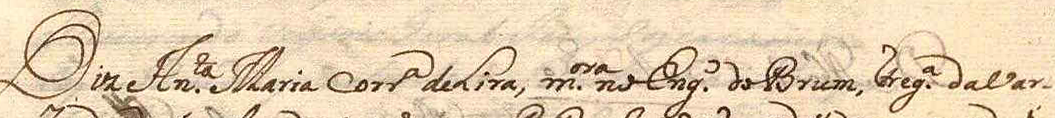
Diz An.ta Maria Corra de Lira, m.ora no Eng.o do Brum, Freg.a da Var
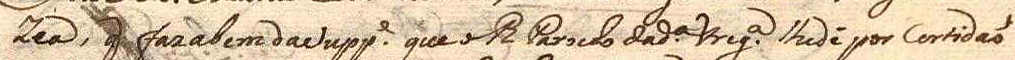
Zea, q̄ faz a bem da supp.e que o R Parocho da d.a Freg.a lhe dé por Certidaõ
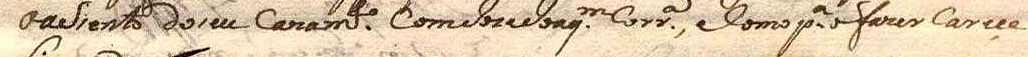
o assento do seu Cazam.to com Ioze Ioaq.m Corr.a, e Como p.a o fazer carece
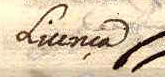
Licença
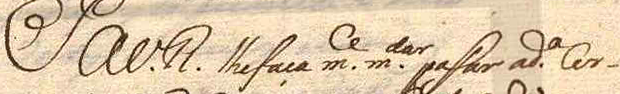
P A V. R. lhe faça m.ce m.dar passar a d.a Cer
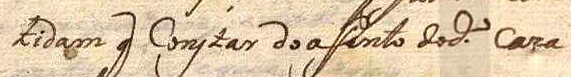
tidam q̄ Constar do asento do d.o caza
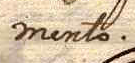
mento.
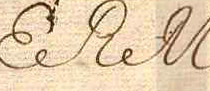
E R M
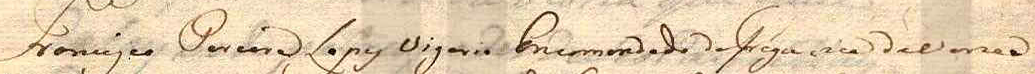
Francisco Pereira Lopes vigario Encomendado da Freguezia da varzea
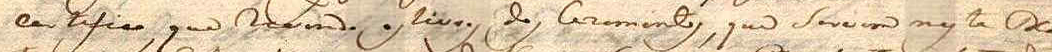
certifico, que Revendo os livros dos Cazamentos, que Servem nesta Ma
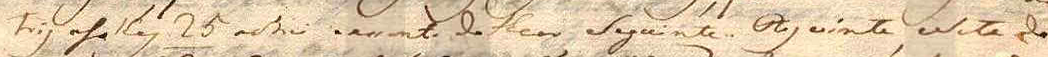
tris a folhas 25 achei o assento do theor seguinte. Aos vinte, e sete do
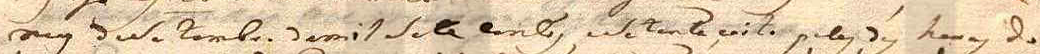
mes de Setembro de mil setecentos e setenta, e oito pelas des horas do
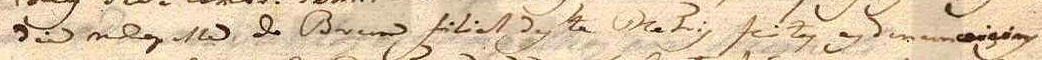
dia na capella do Brum filial desta Matris feitas as denunciaçoins
